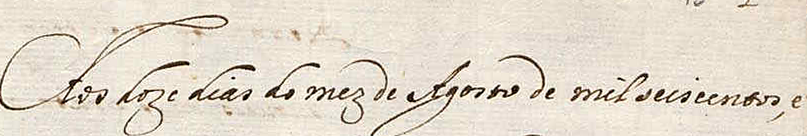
Aos doze dias do mez de Agosto de mil seiscentos, e
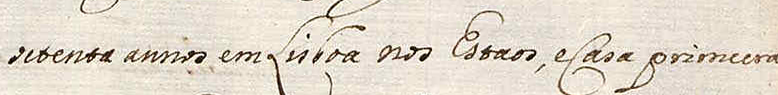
setenta annos em Lisboa nos Estaos, e Casa primeira
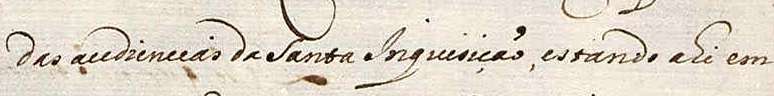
das audiencias da Santa Jnquisiçaõ, estando ahi em
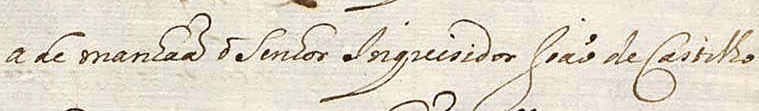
a de manhaã o Senhor Jnquisidor João de Castilho
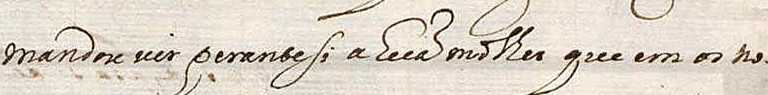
mandou vir perante si a huā molher que em os no
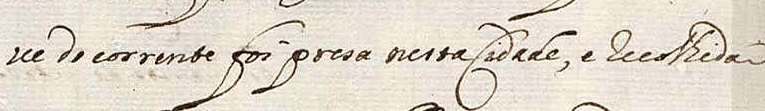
ve do corrente foi presa nesta Cidade, e recolhida
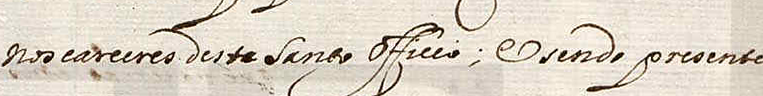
nos carceres deste Santo officio; E sendo presente
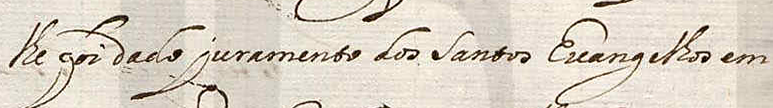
lhe foi dado juramento dos Santos Evangelhos em
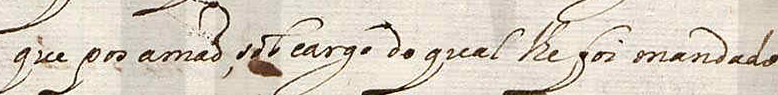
que pos a mão, sob cargo do qual lhe foi mandado
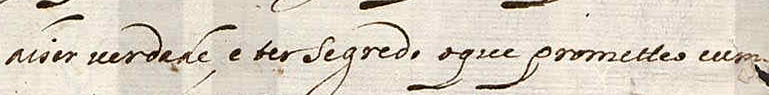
diser verdade, e ter segredo o que prometteo cum
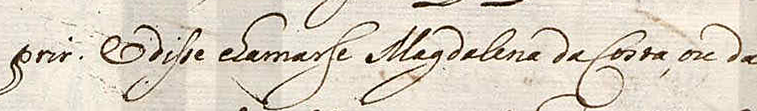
prir. E disse chamarse Magdalena da Costa, ou da
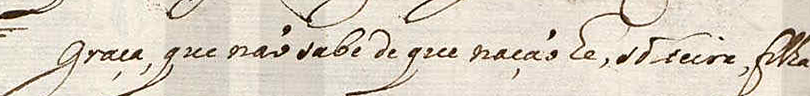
graça, que naõ sabe de que nação he, solteira, filha
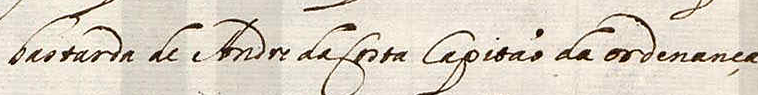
bastarda de Andre da Costa Capitão da ordenança
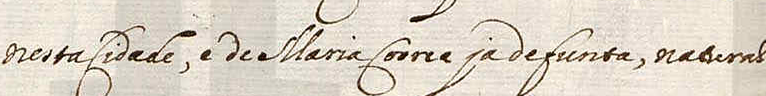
nesta Cidade, e de Maria Correa ja defunta, natural
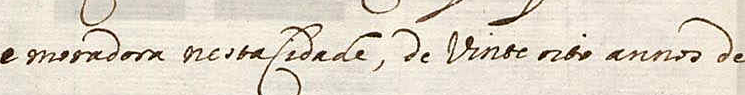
e moradora nesta Cidade, de Vinte oito annos de
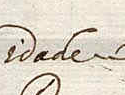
idade
